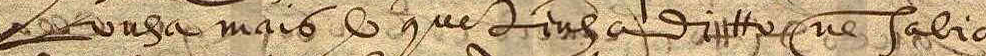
cousa mais do que tinha ditto n̄e sabia
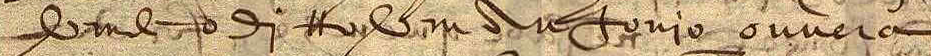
domde o djtto dom Antonio ouuera
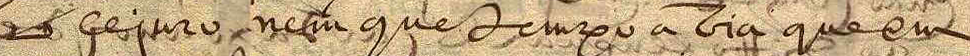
o lljuro nem que tempo avia que em
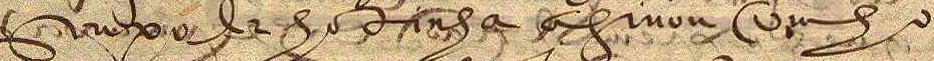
Seu poder ho tinha asinou Com ho
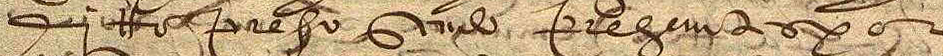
djtto preso Sendo presemtes por
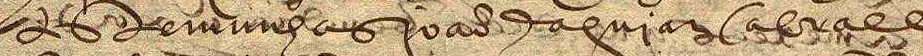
testemunhas Joaõ dagujar Cabrall
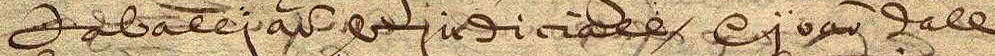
taballjaõ do Judiciall / e joaõ dall
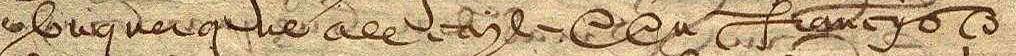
buquerque allcajde e eu francysço
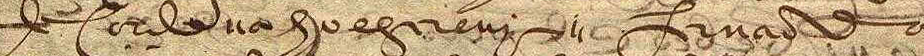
de Cordoua ho escreuj // fernaõ da
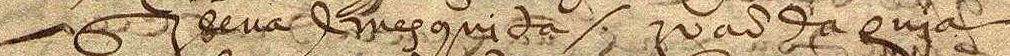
SJllua de mesquita /. Joaõ daguiar
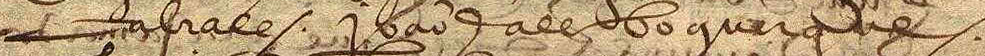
Cabrall /. Joaõ dalboquerque /.
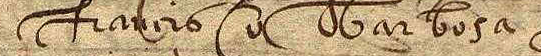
françisCo barbosa
